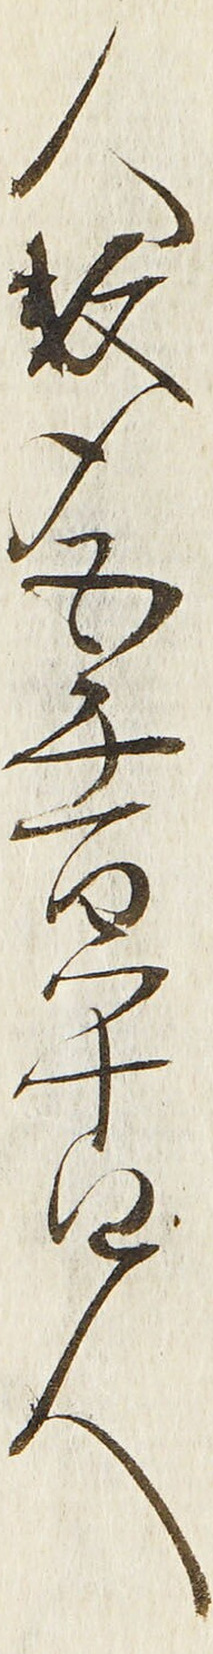人数〆五千百四十四人
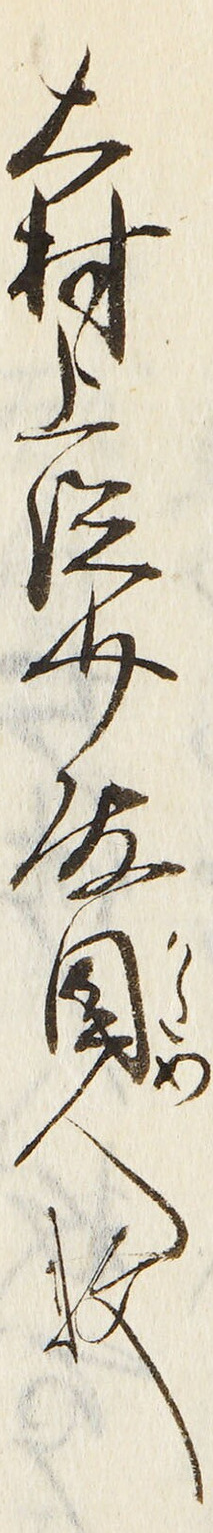大村上総介殿固人数
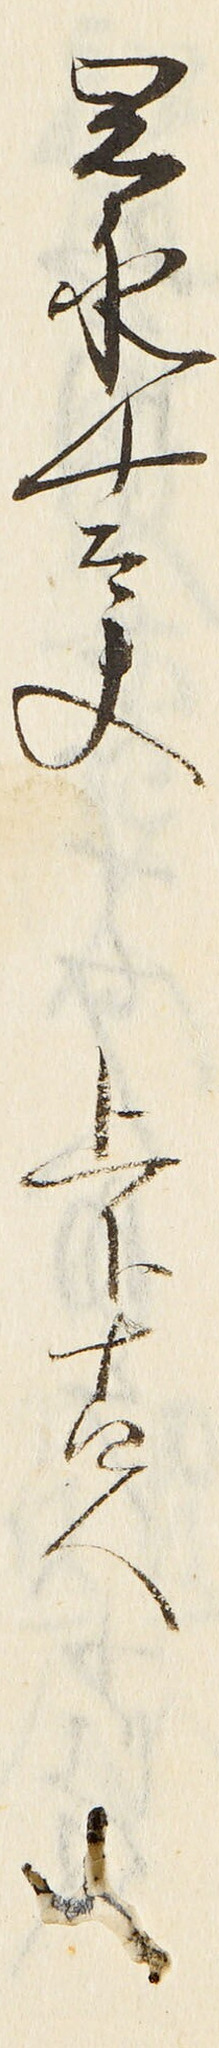岩永十太夫上下十四人
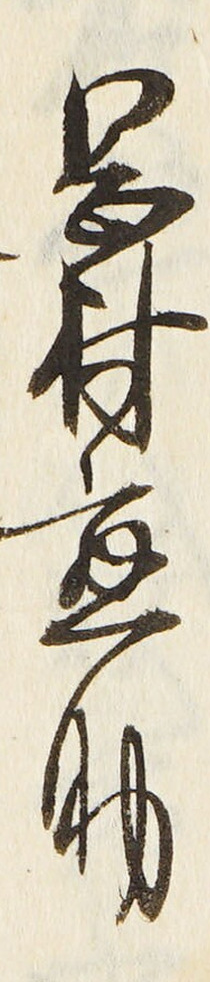岡村応助
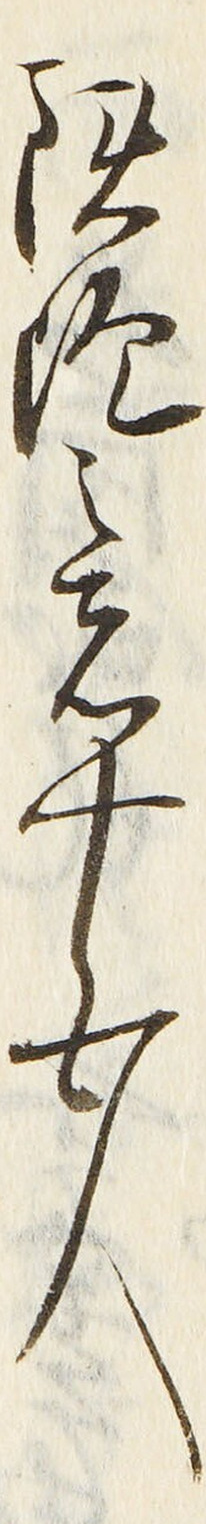鉄炮之者十五人
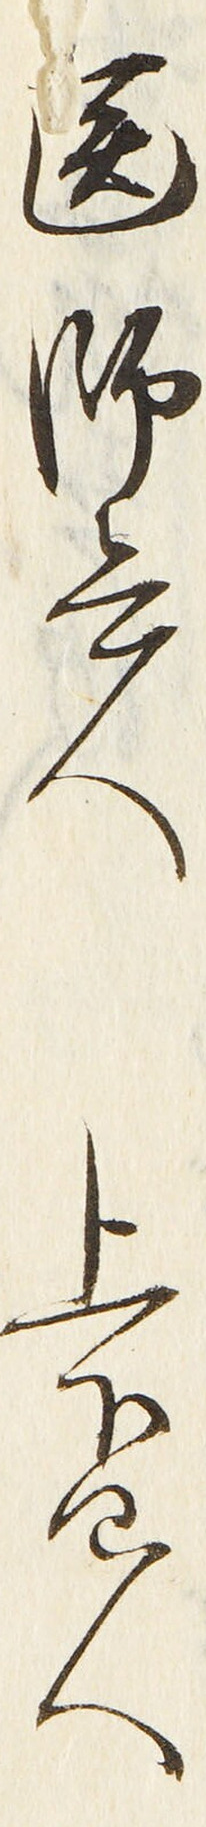医師壱人上下四人
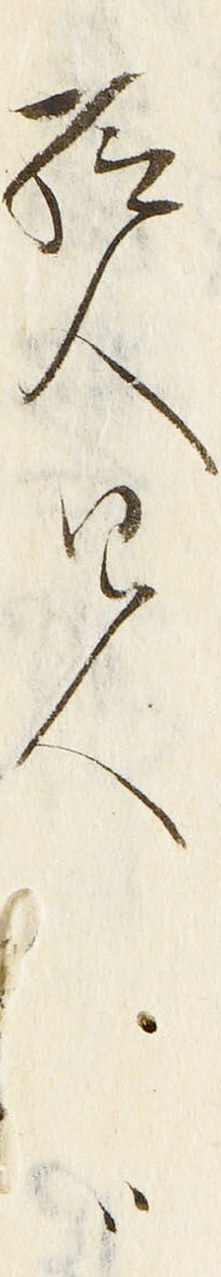詰人四人〃

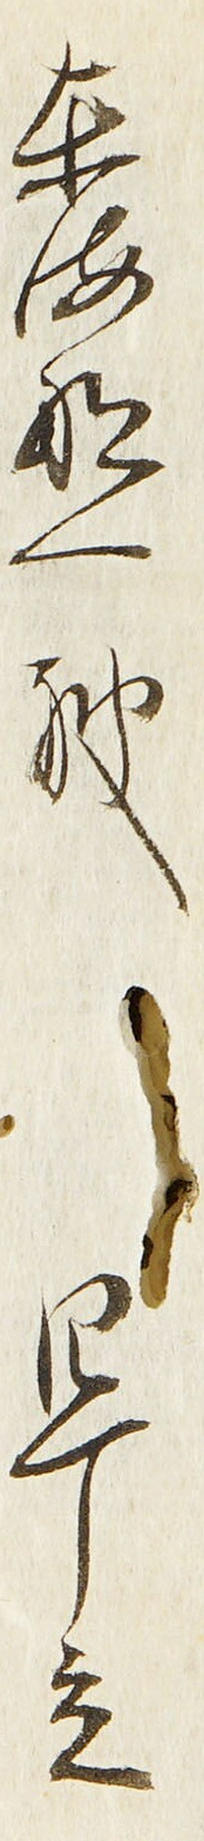東海船一艘四丁立
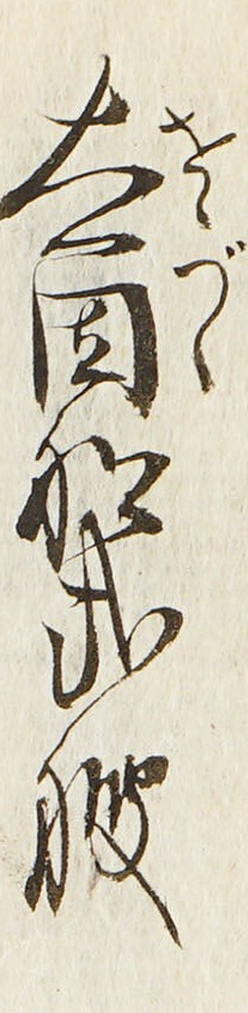大筒船弐艘
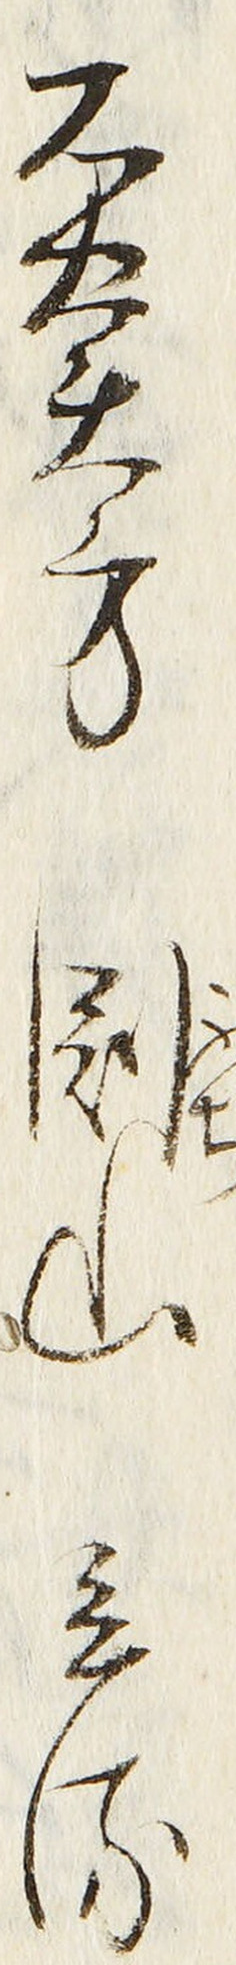石火矢方渕山兵衛
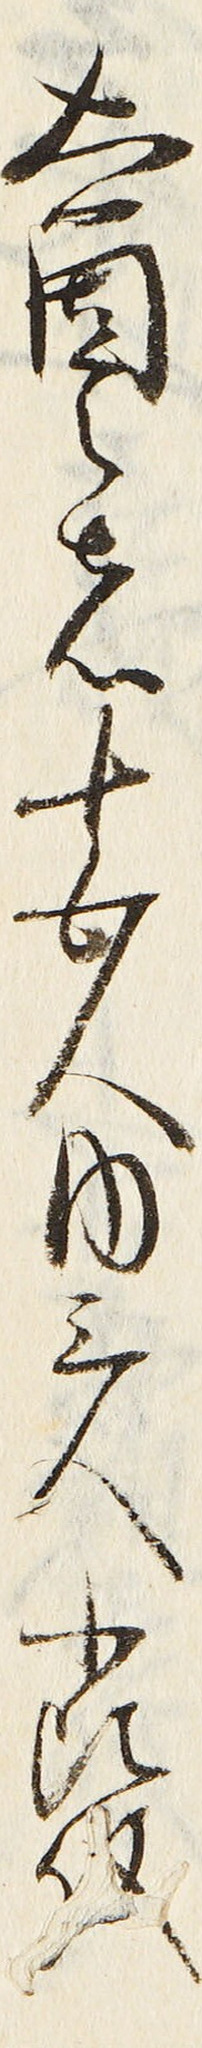大筒之者十五人内三人小頭役
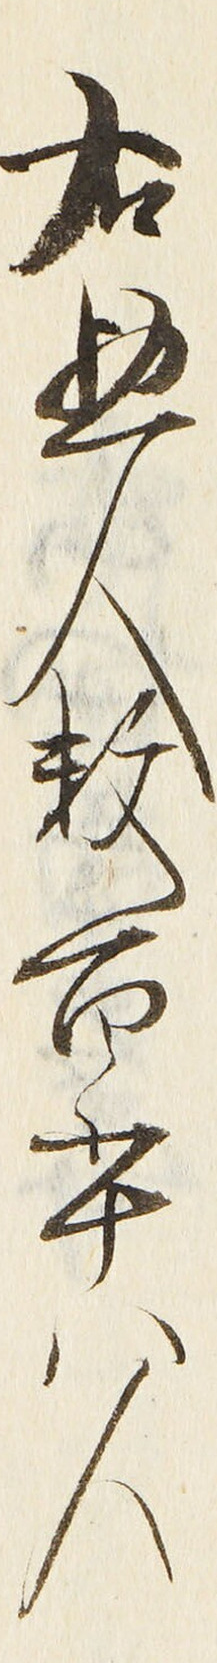右惣人数百五十八人
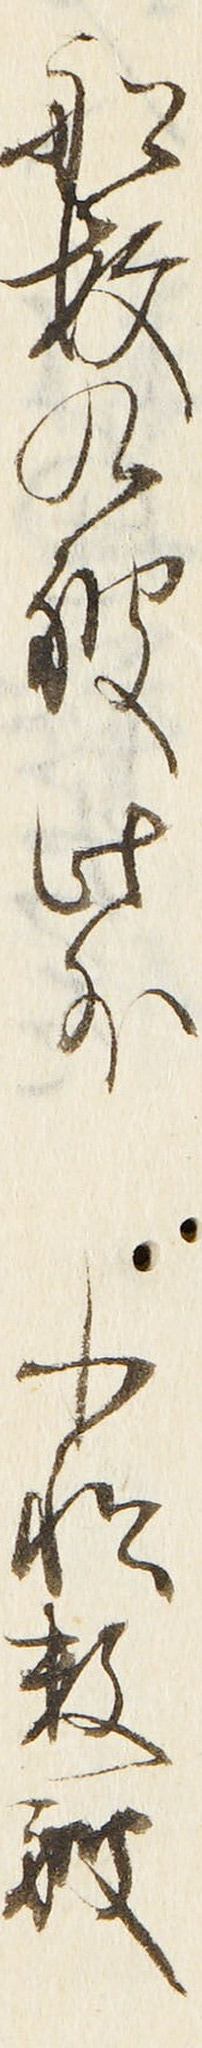船数九艘此外小船数艘
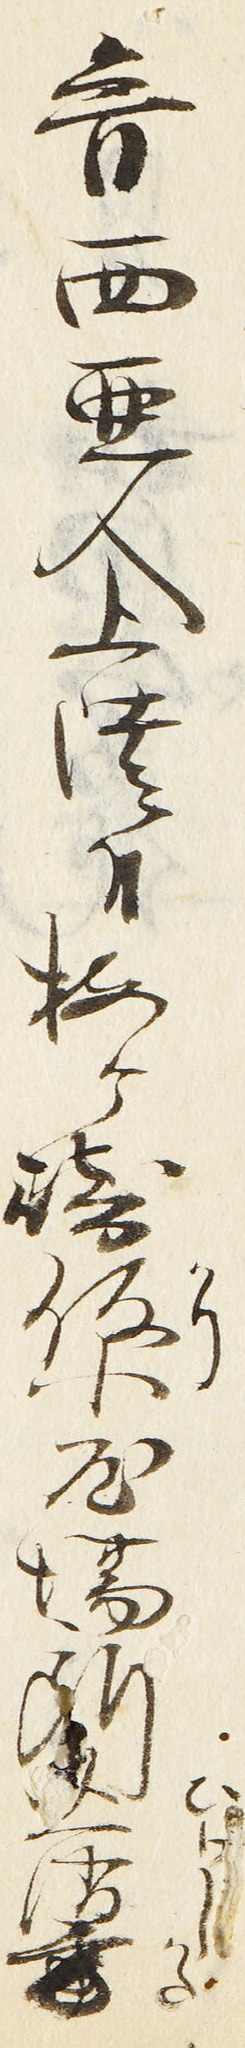魯西亜人上陸に付梅ヶ崎仮屋場所火消方
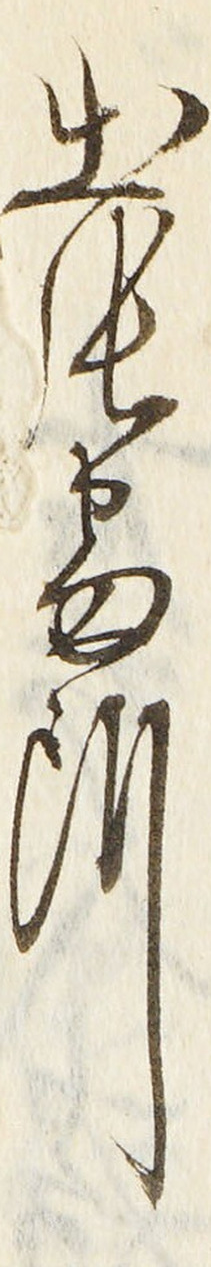出張番所
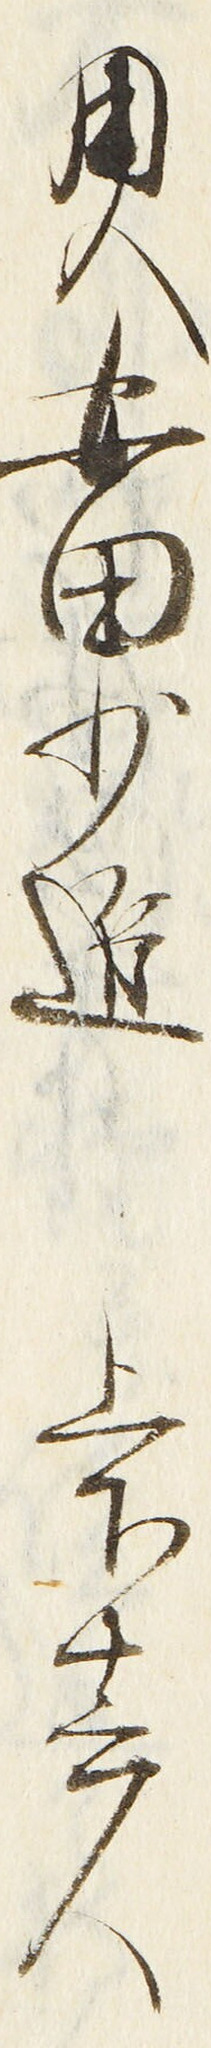用人安田少進上下十六人
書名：魯西亜国舟渡来始末并日本流漂人異国遍歴之話（西洋欧羅巴州之内一）
